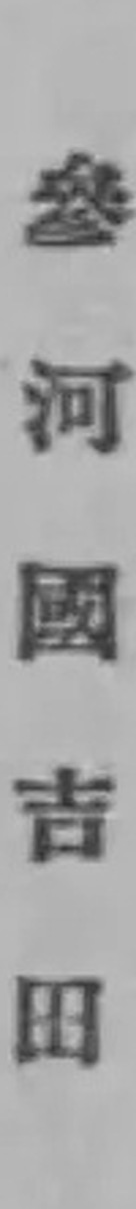参河国吉田
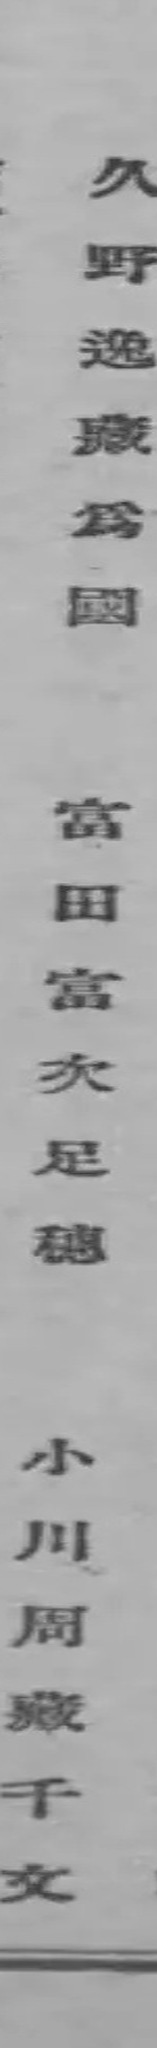久野逸蔵爲國富田富次足穂小川周蔵千文
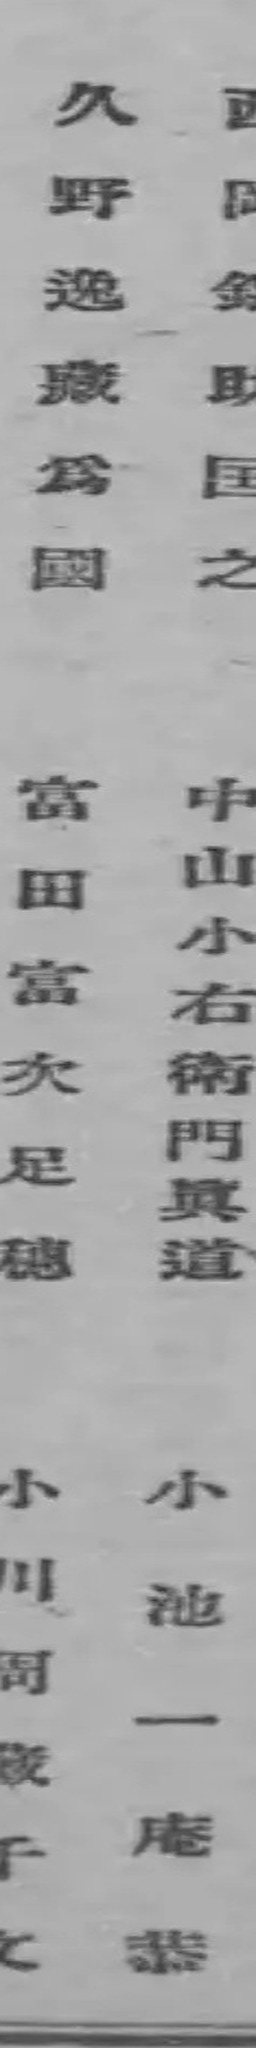久野逸蔵爲國富田富次足穂小川周蔵千文
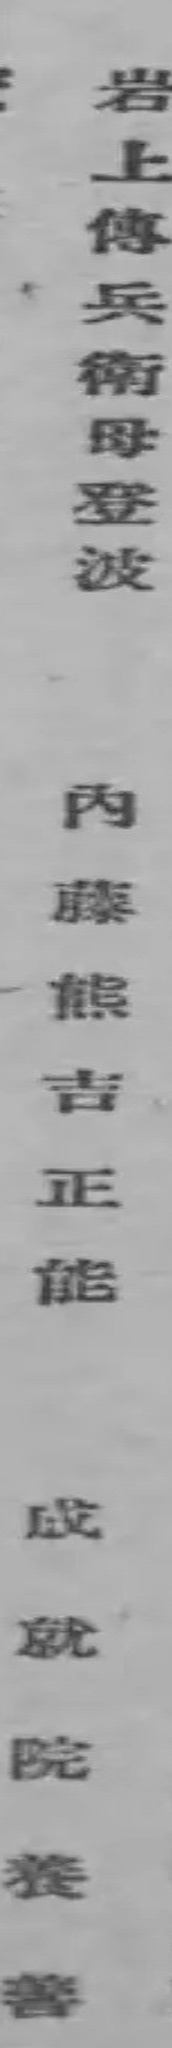岩上伝兵衛母登波内藤熊吉正能成就院養善
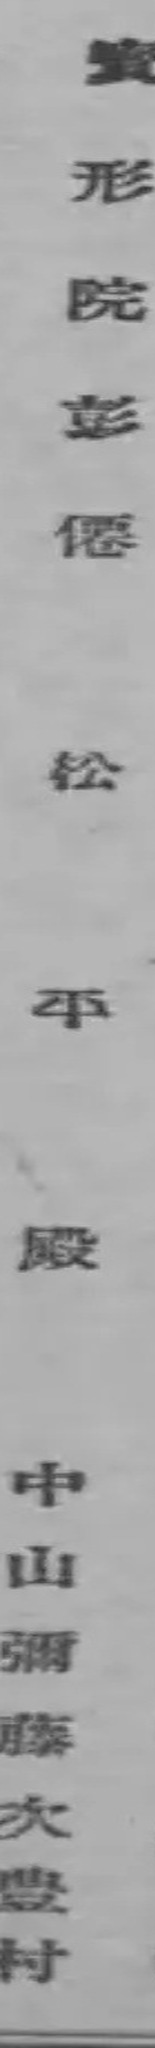寶形院彰僊松平殿中山彌藤次豊村
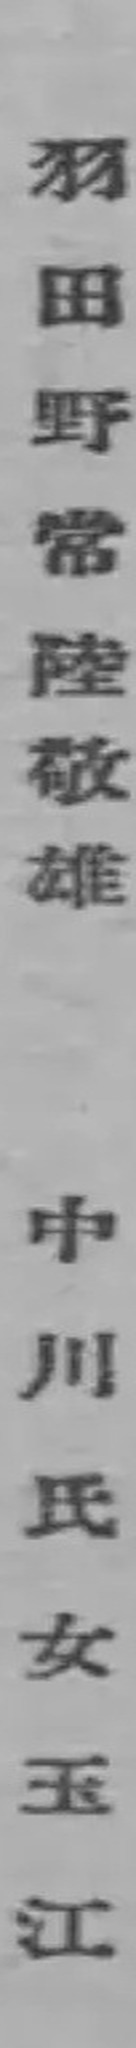羽田野常陸敬雄中川氏女玉江
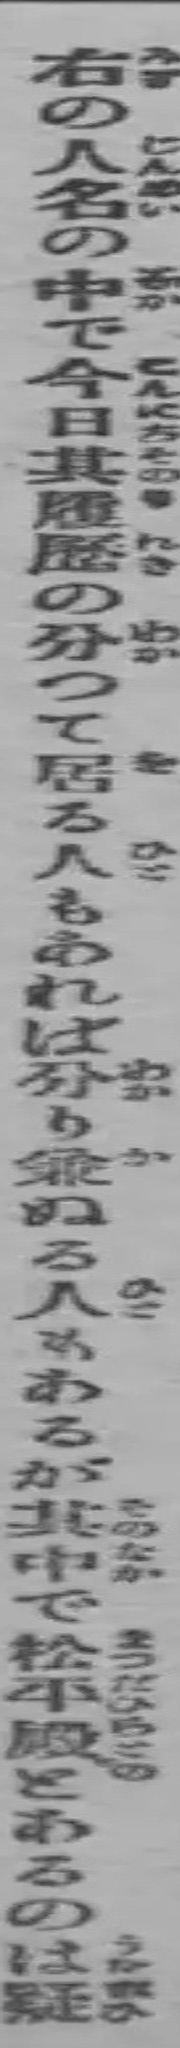右の人名の中で今日其履歴の分つて居る人もあれば分り兼ぬる人もあるが其中で松平殿とあるのは疑
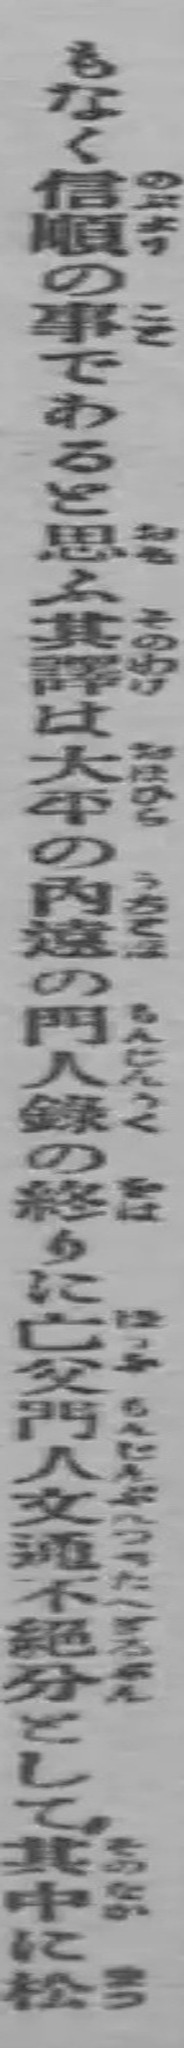もなく信順の事であると思ふ其訳は大平の内遠の門人録の終りに亡父門人文通不絶分として其中に松
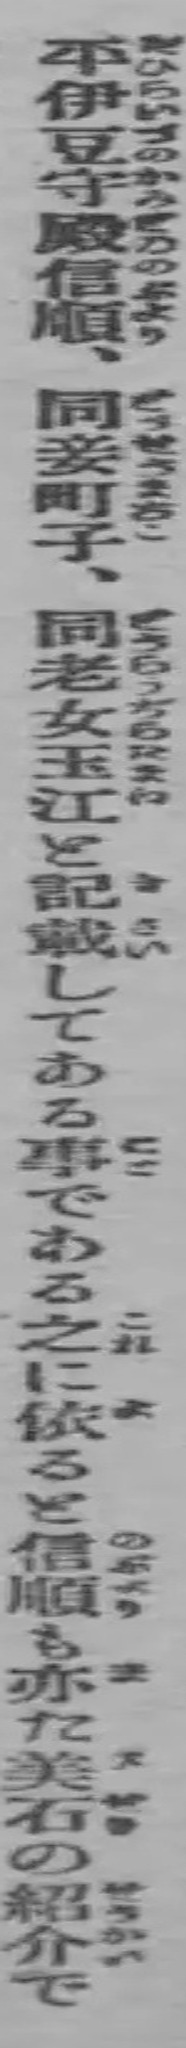平伊豆守殿信順、同妾町子、同老女玉江と記載してある事である之に依ると信順も亦た美石の紹介で
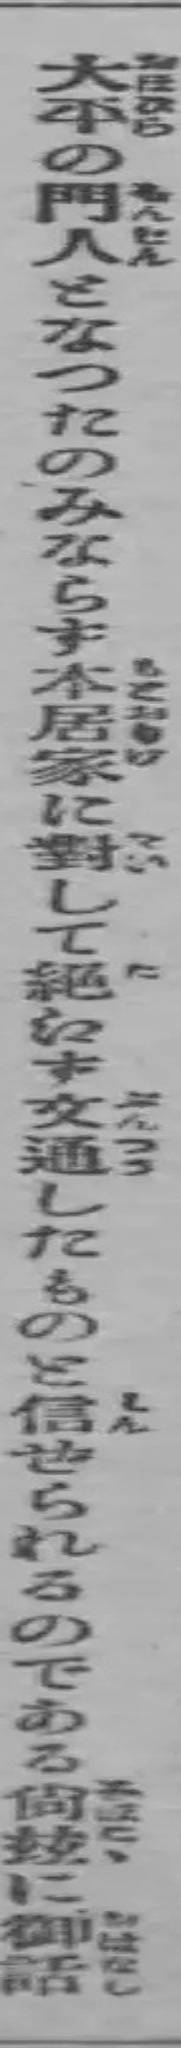大平の門人となつたのみならず本居家に対して絶えず文通したものと信ぜられるのである尚茲に御話
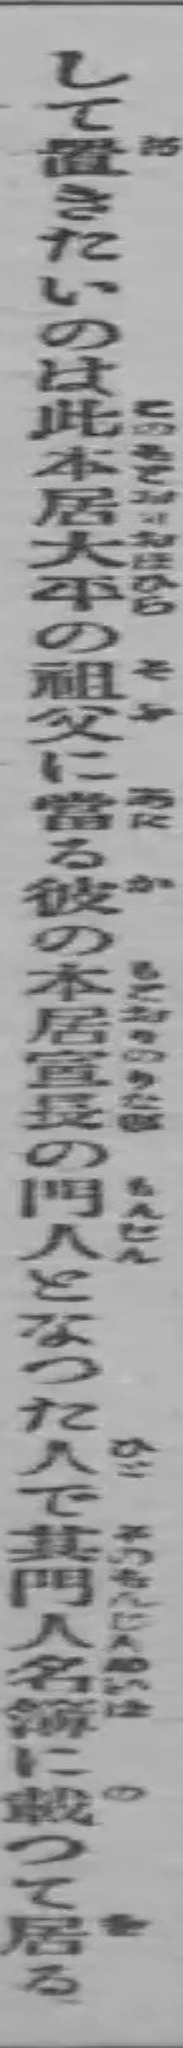して置きたいのは此本居大平の祖父に当る彼の本居宣長の門人となつた人で其門人名簿に載つて居る
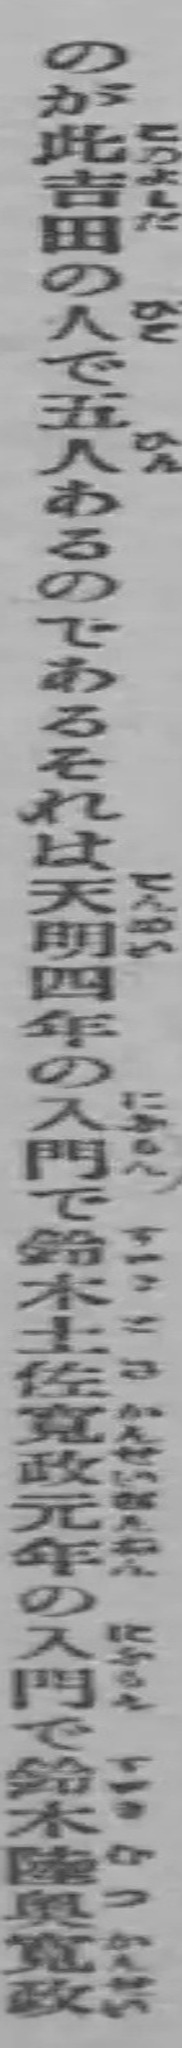のが此吉田の人で五人あるのであるそれは天明四年の入門で鈴木土佐寛政元年の入門で鈴木陸奥寛政
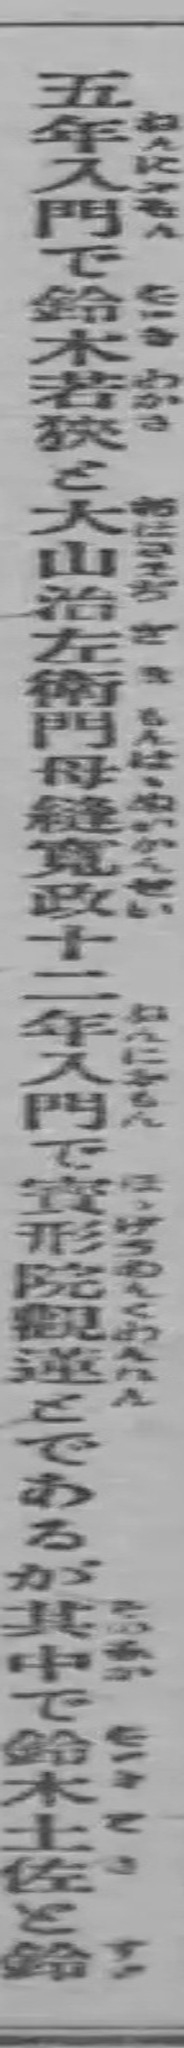鈴木土佐五年入門で鈴木若狭と大山治左衛門母縫寛政十二年入門で寶形院観蓮とであるが其中で鈴木土佐と鈴
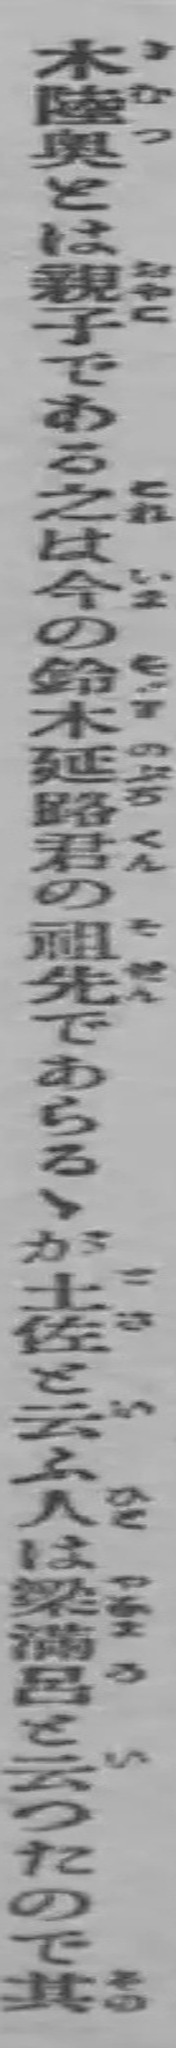木陸奥とは親子である之は今の鈴木延路君の祖先であらるゝが土佐と云ふ人は梁満呂と云つたので其
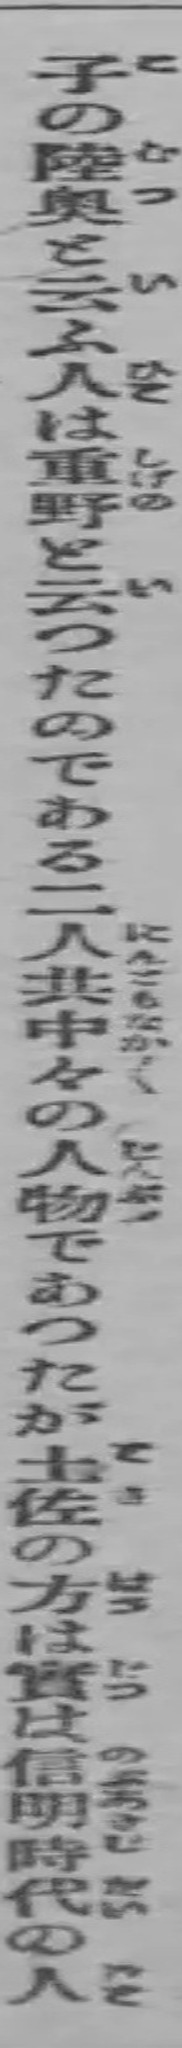鈴木陸奥子の陸奥と云ふ人は重野と云つたのである二人共中々の人物であつたが土佐の方は実に信明時代の人
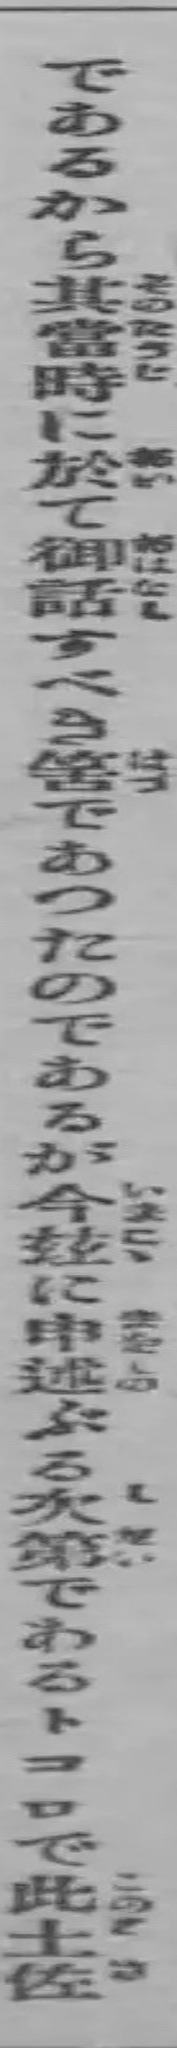であるから其当時に於て御話すべき筈であつたのであるが今茲に申述ぶる次第であるトコロで此土佐
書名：豊橋市史談
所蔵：国立国会図書館 National Diet Library, JAPAN
